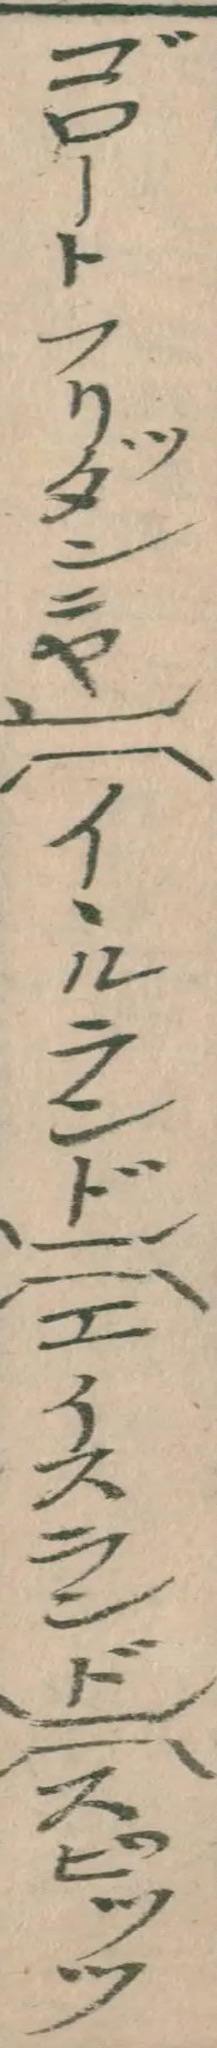ゴロートフリッタンニヤ)(イヽルランド)(エイスランド)(スピッツ

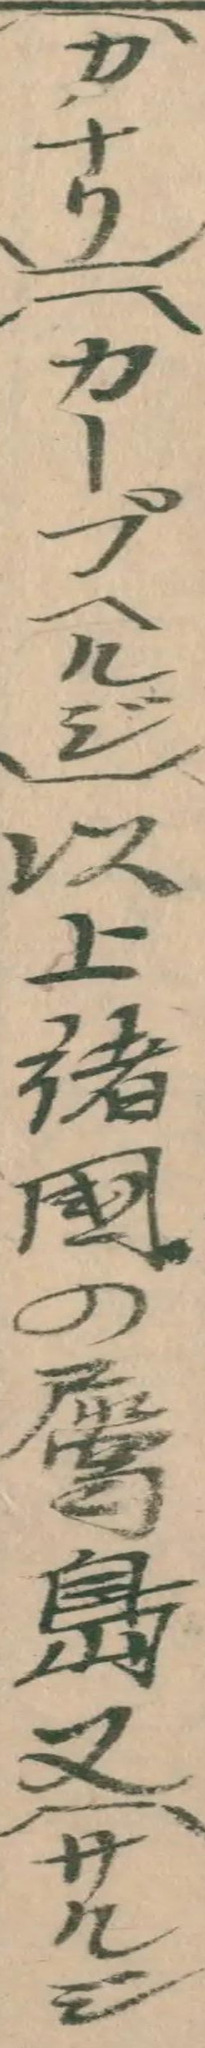(カナリ)(カープヘルジ)以上諸国の属島又(サルジ
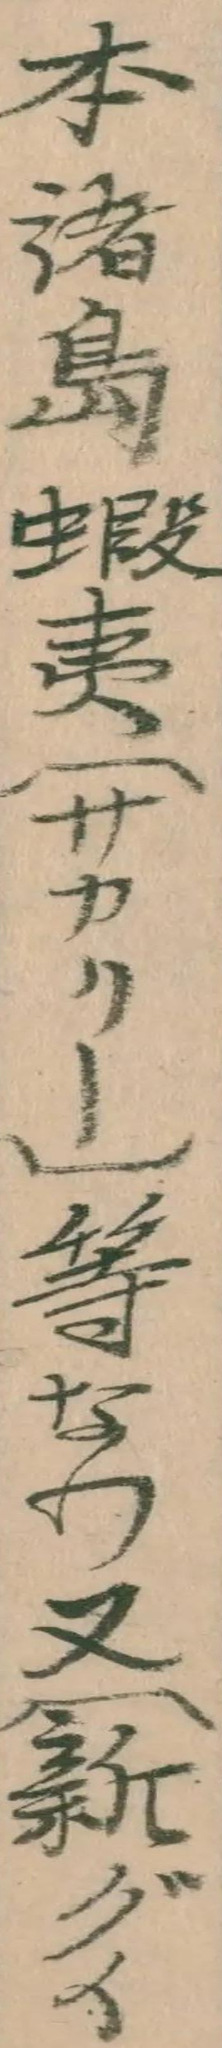本諸島蝦夷(サカリー)等なり又(新グイ
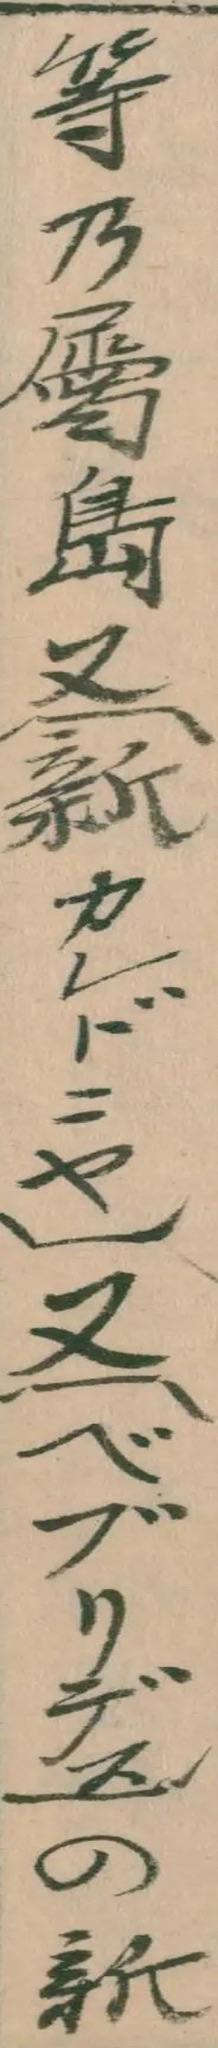等の属島又(新カレドニヤ)又(ベブリデス)の新
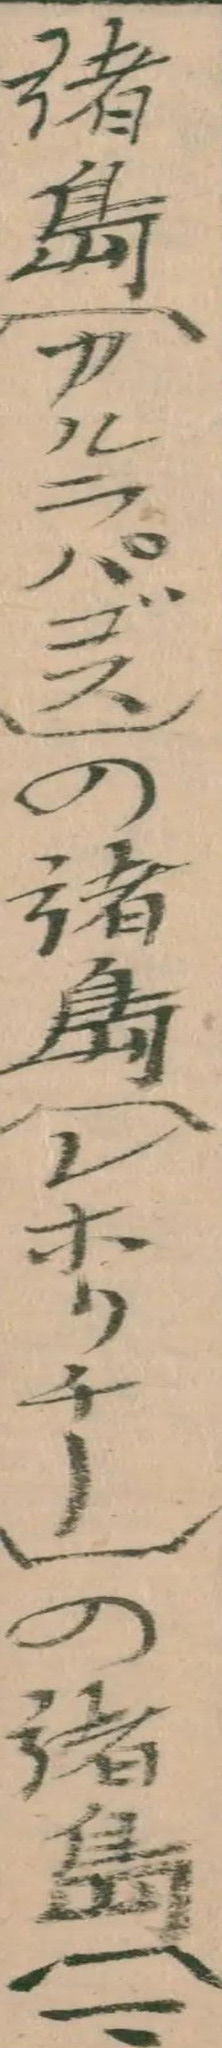諸島(カルラパゴス)の諸島(レホリチー)の諸島(マ
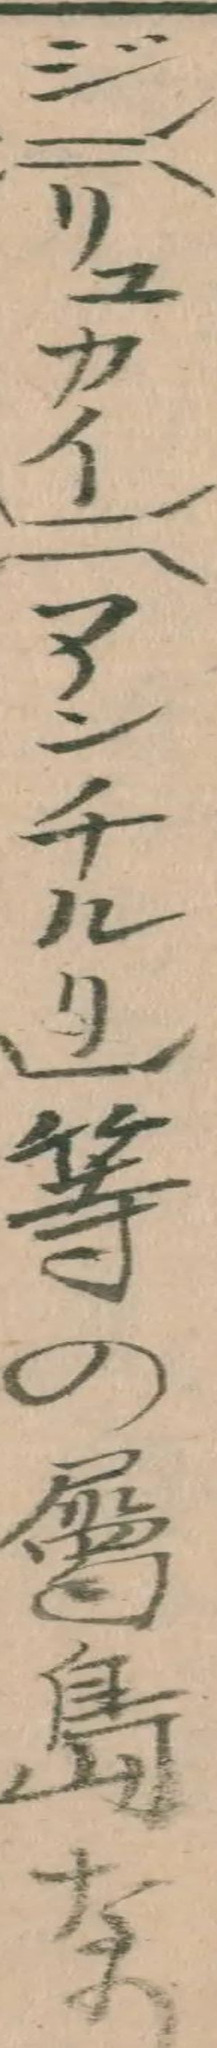ジ)(リュカイ)(アンチルリ)等の属島なり
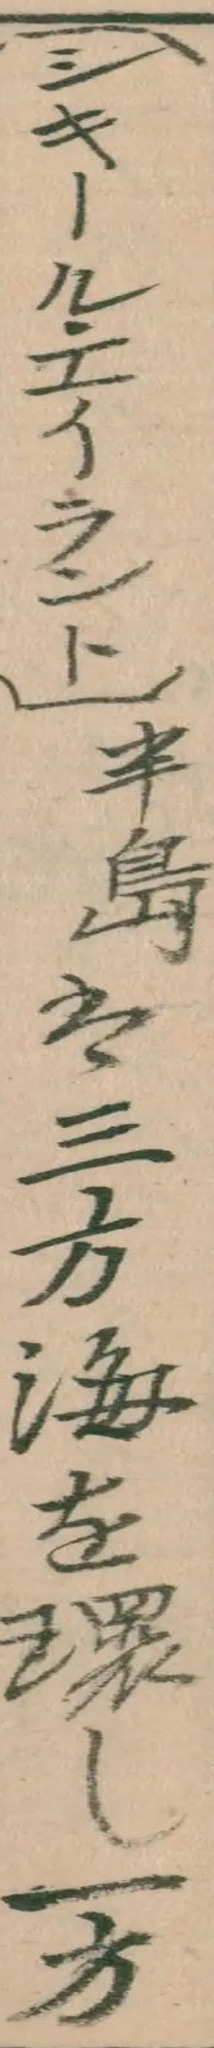(シキール・エイラント)半島は三方海を環し一方
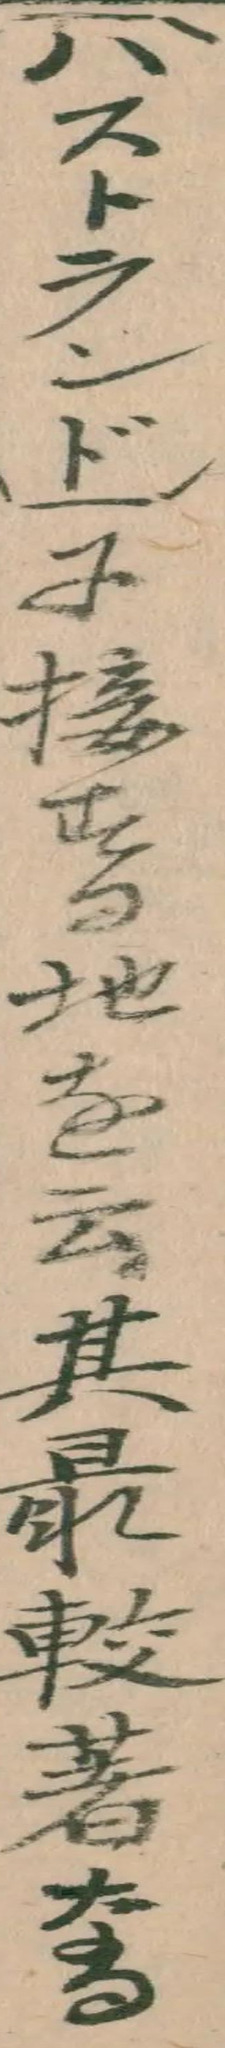(ハストランド)に接する地を云其最較著なる
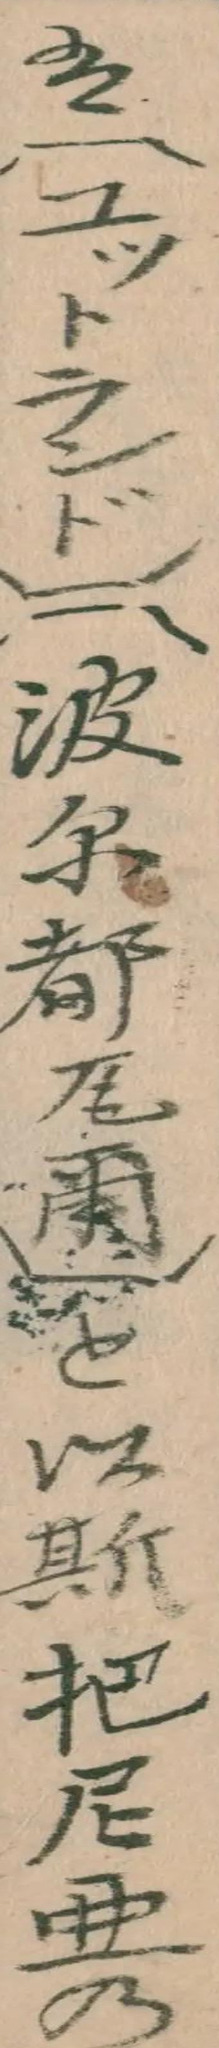は(ユットランド)(波尓都瓦爾)と以斯把尼亜の

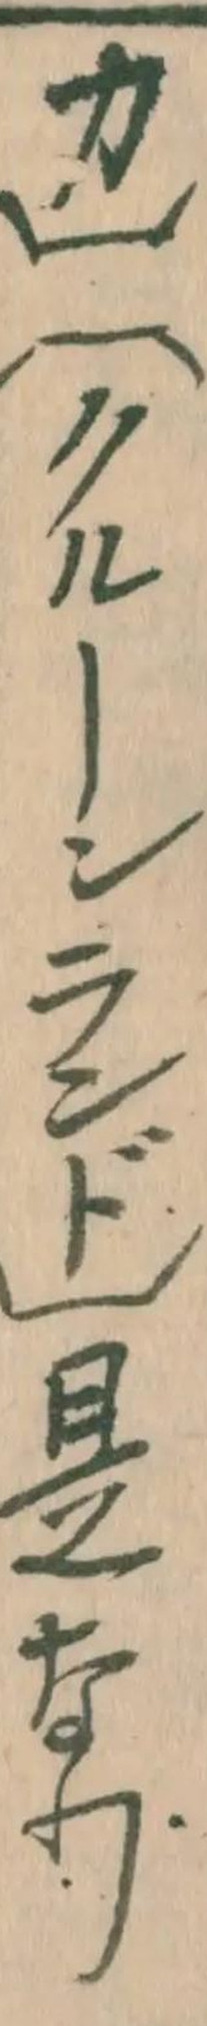カ)(クルーンランド)是なり
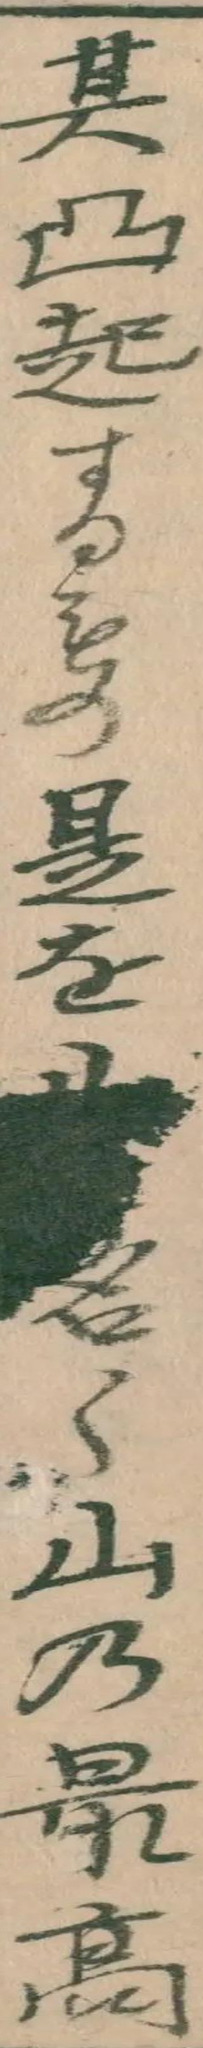其凸起するもの是を山名く山の最高
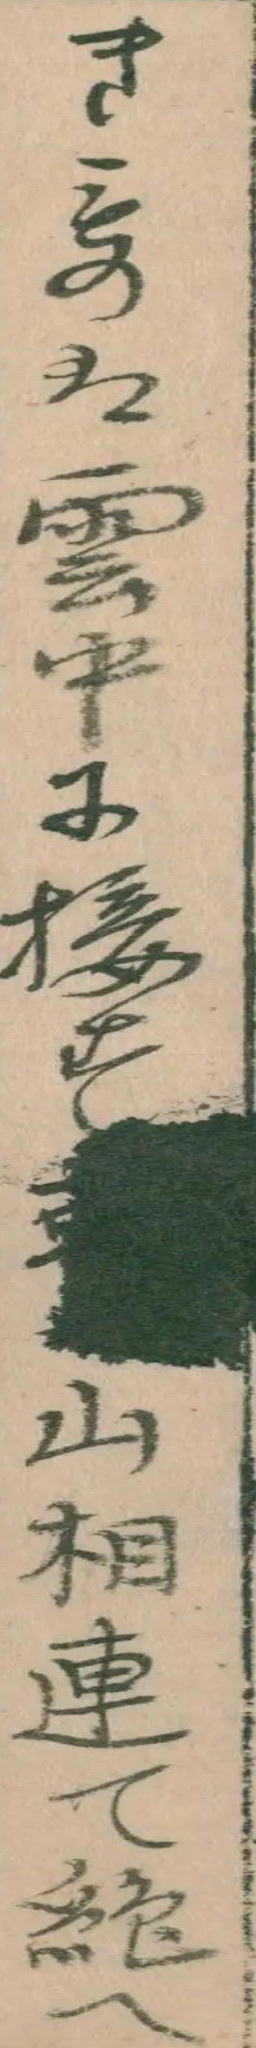きものは雲中に接す山相連て絶へ
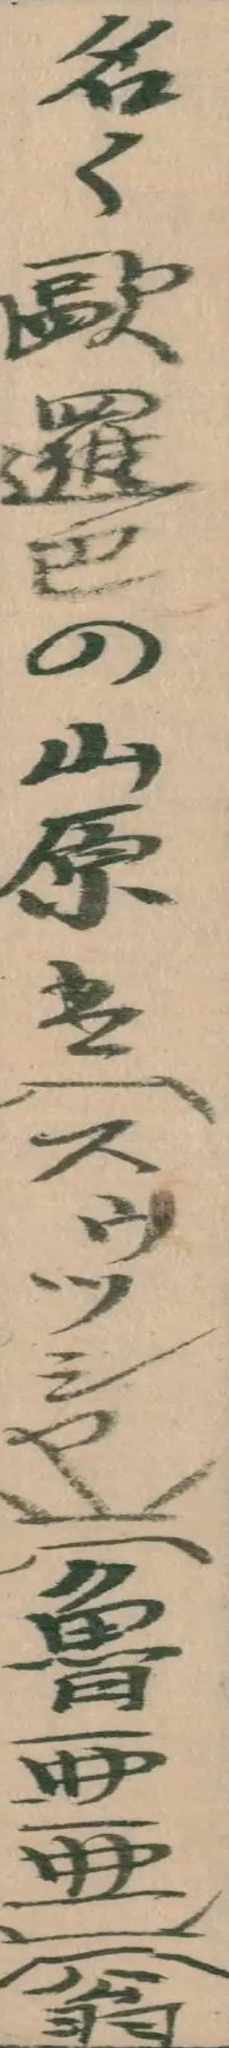名く欧邏巴の山原は(スゥツシヤ)(魯西亜)(翁
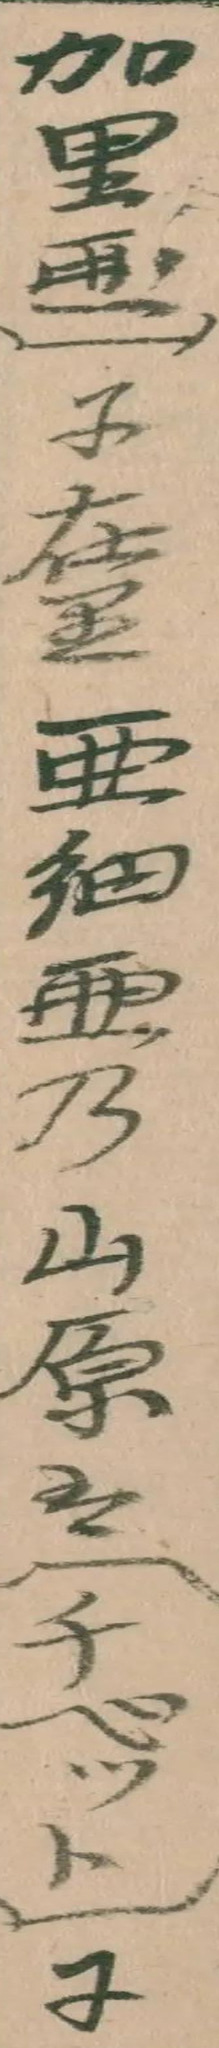加里亜)に在り亜細亜の山原は(チベット)に
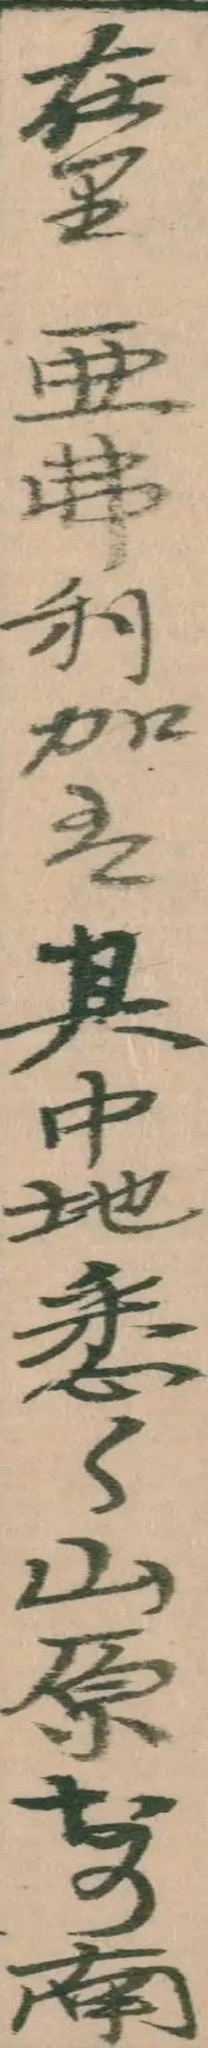在り亜弗利加は其中地悉く山原なり南
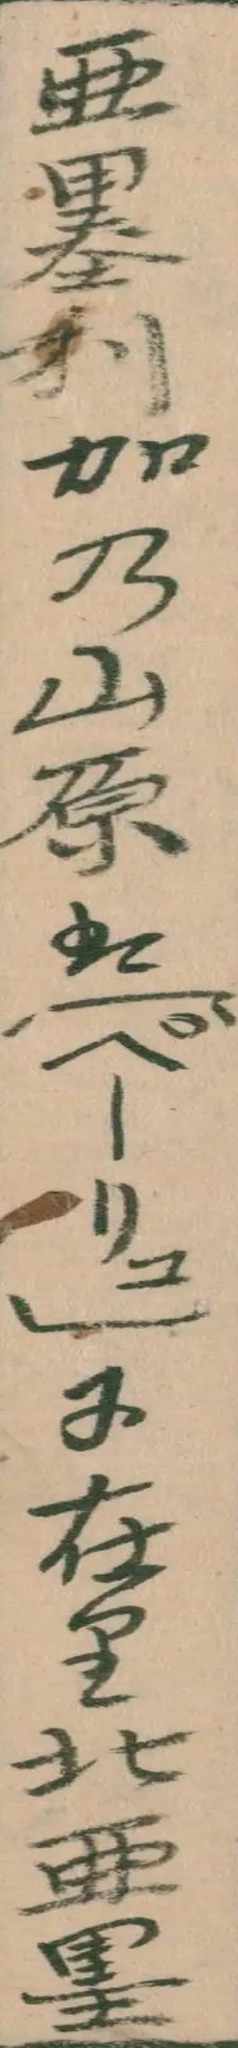亜墨利加の山原は(ペーリュ)に在り北亜墨
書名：新釈輿地図説
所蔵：国立国会図書館 National Diet Library, JAPAN
